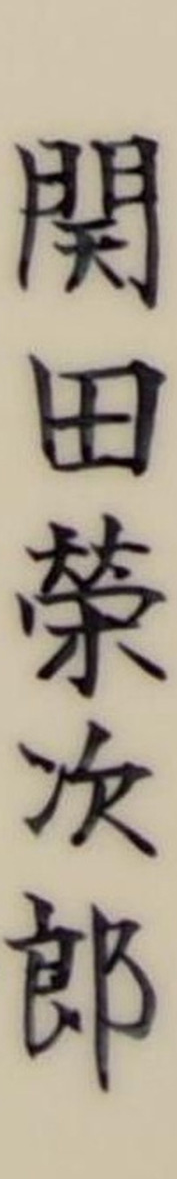関田榮次郎
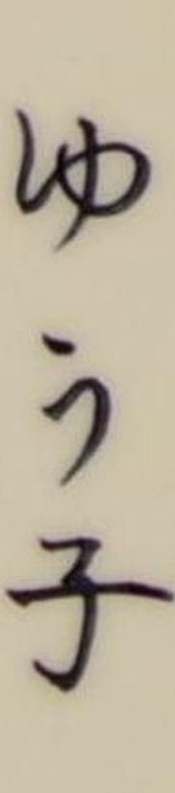ゆう子
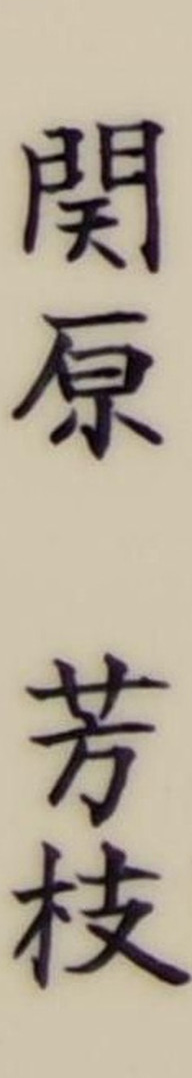関原芳枝
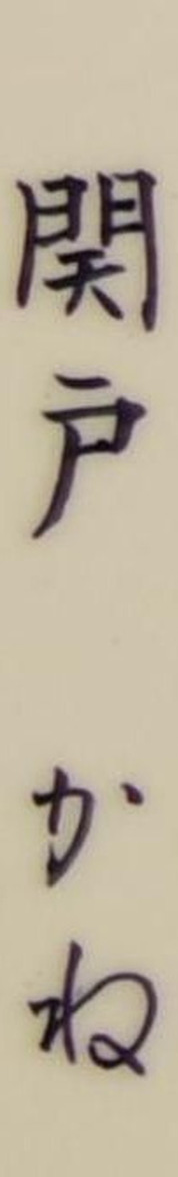関戸かね
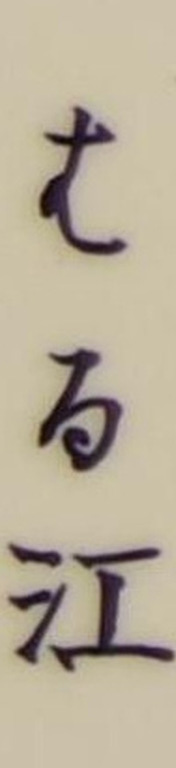はる江

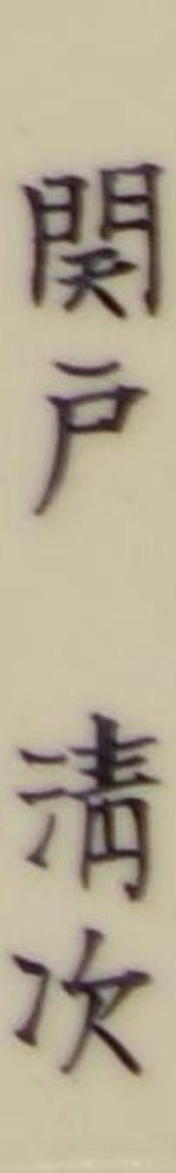関戸清次
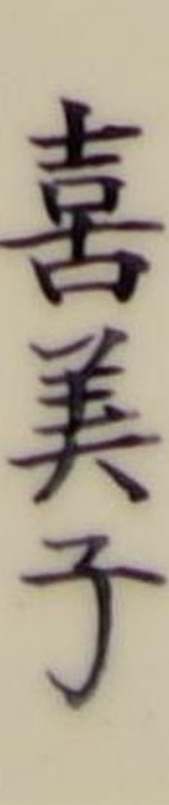喜美子
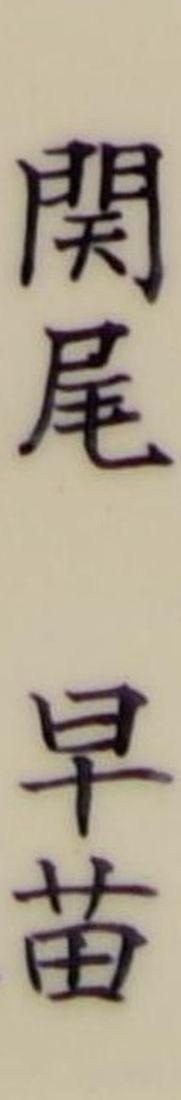関尾早苗
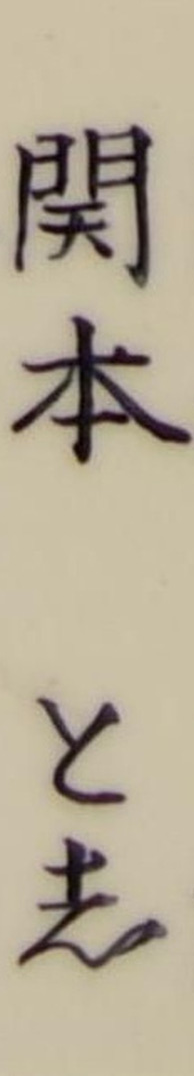関本とし
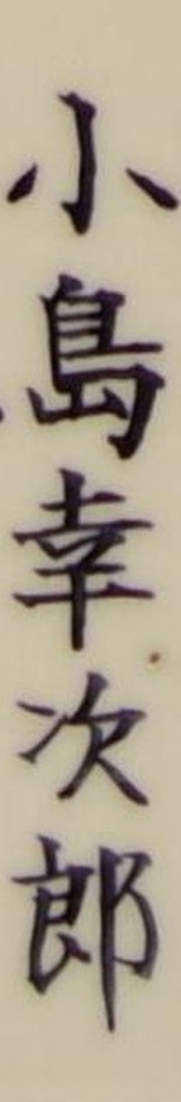小島幸次郎
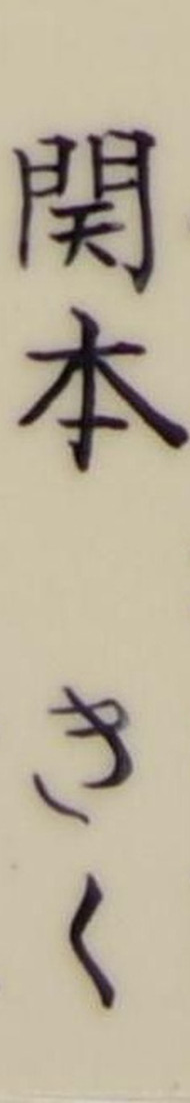関本きく
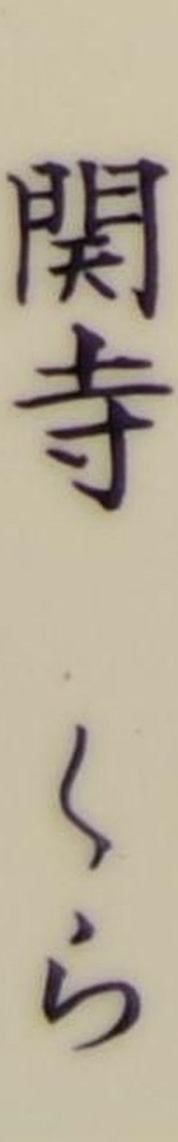関寺くら
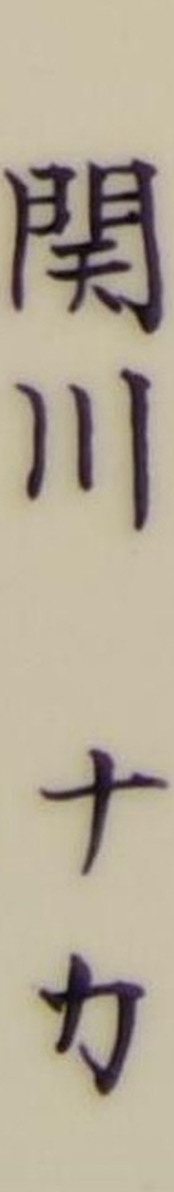関川ナカ
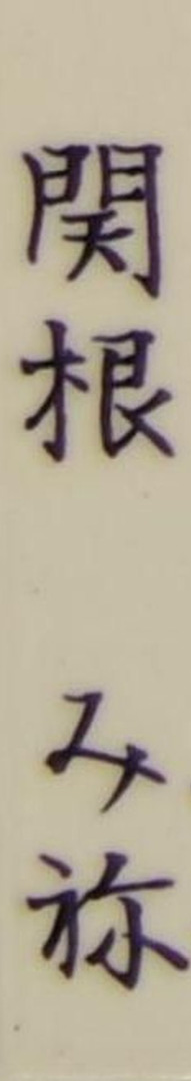関根みね

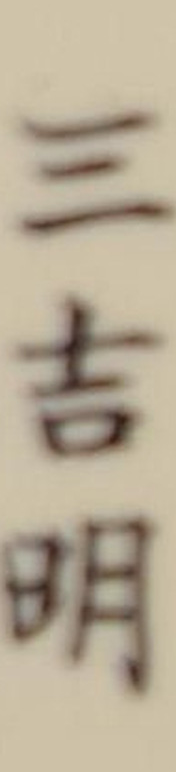三吉明
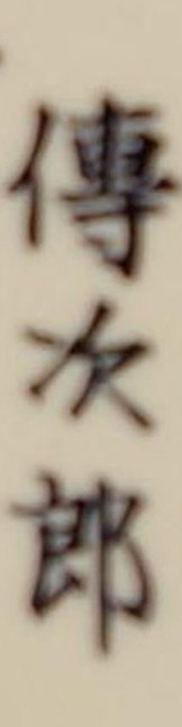傳次郎
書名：A~D
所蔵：koyasan kongobuji
